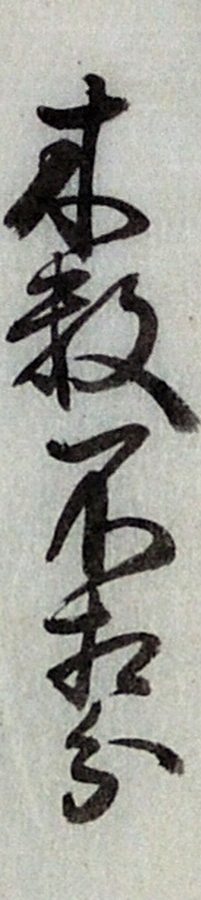木数不相分
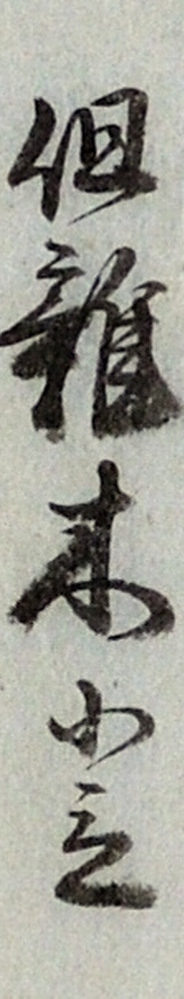但雑木小立
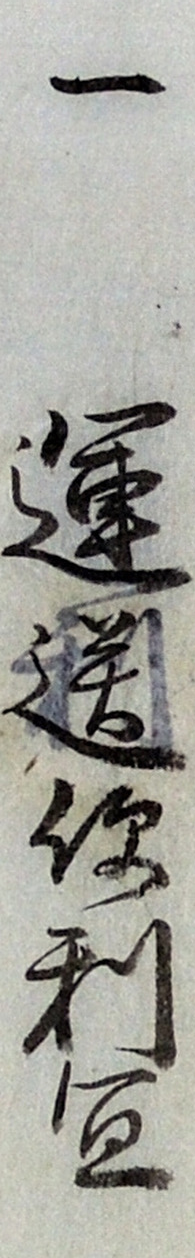一運送便利宜
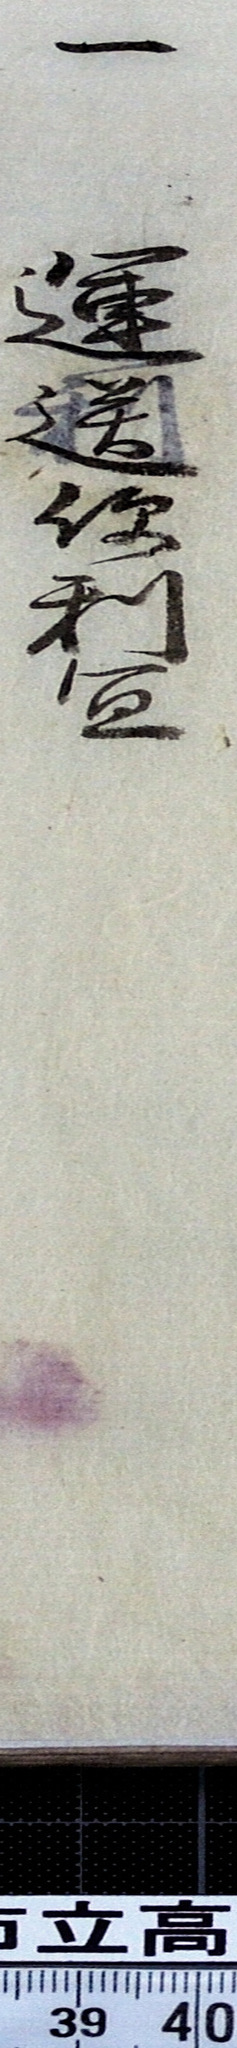一運送便利宜
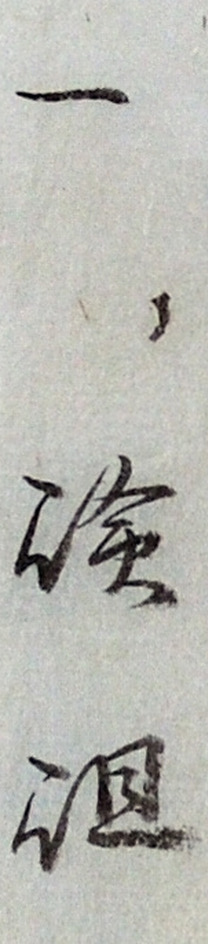一嶮岨

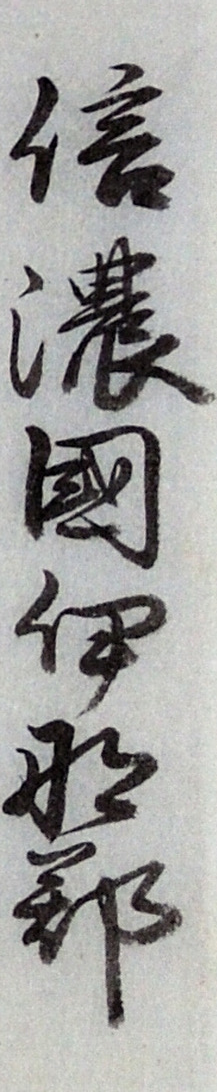信濃国伊那郡
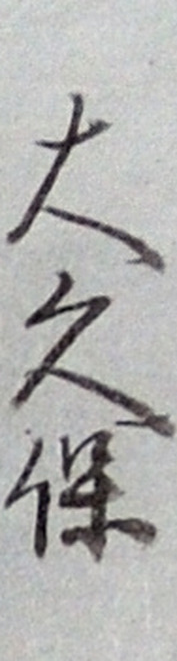大久保
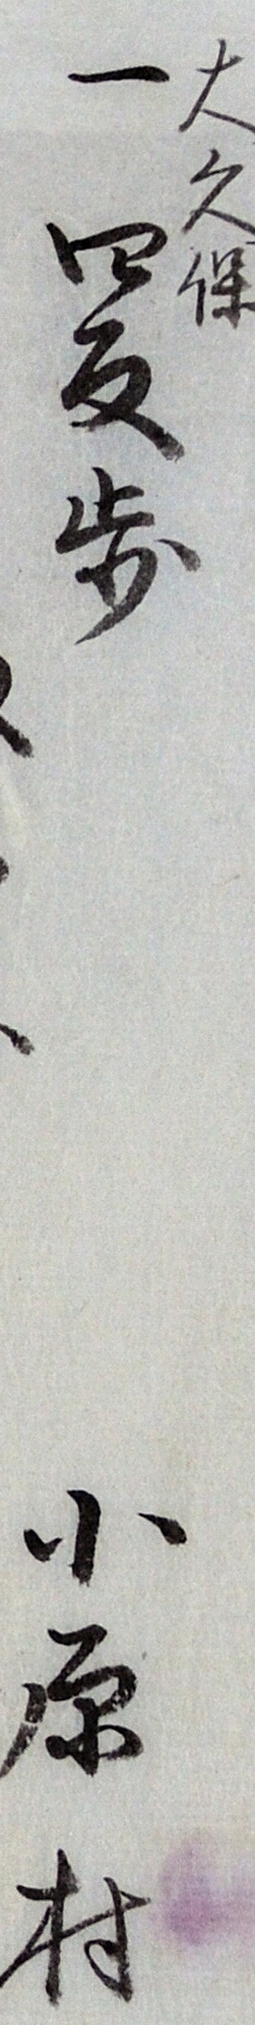一四反歩小原村
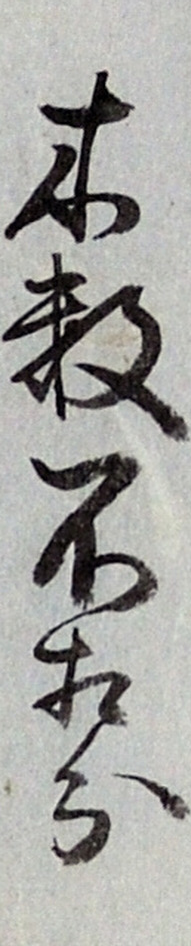木数不相分
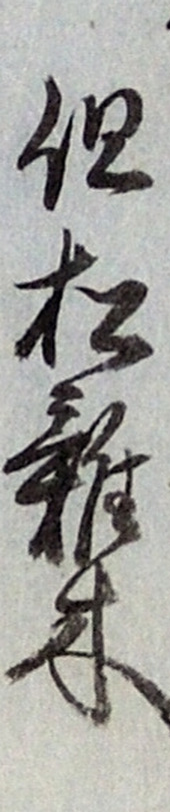但松雑木
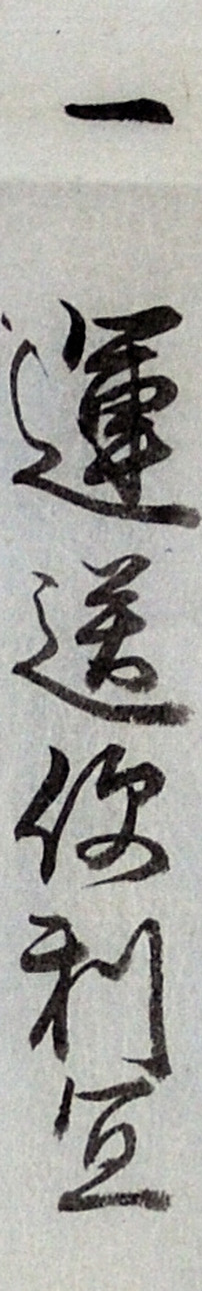一運送便利宜
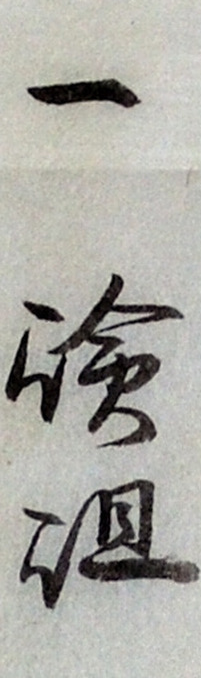一嶮岨
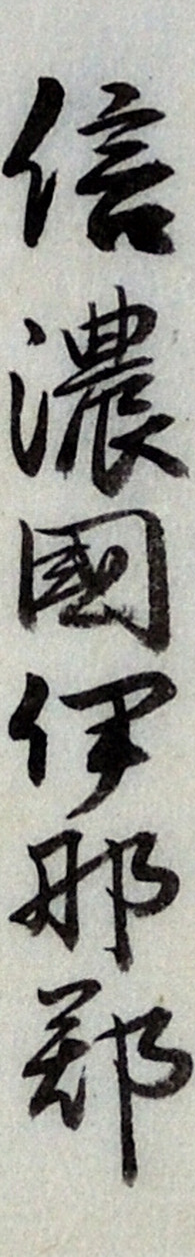信濃国伊那郡
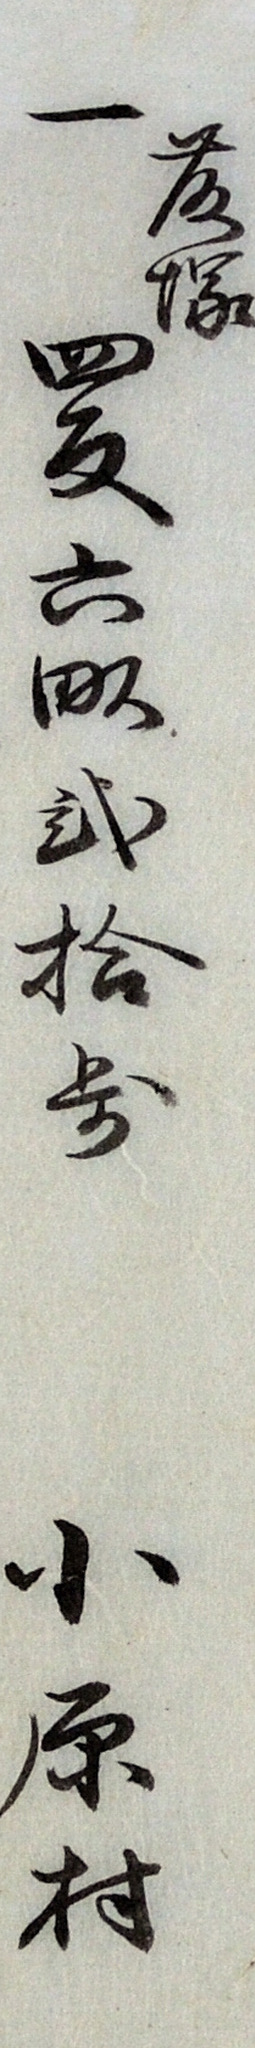一四反六㽗弐拾歩小原村
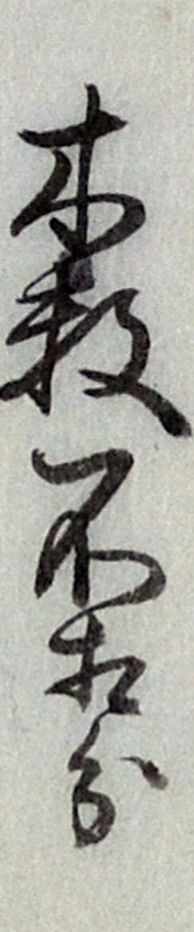木数不相分
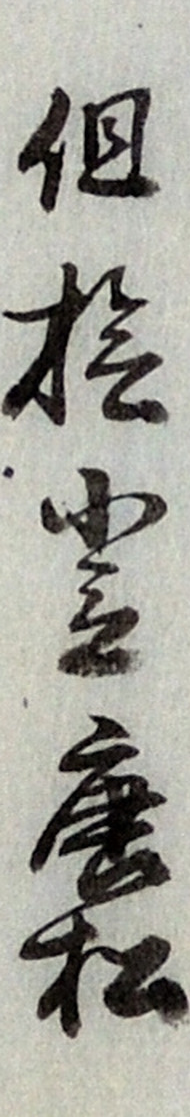但桧小立唐松
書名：官林反別帳
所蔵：伊那市立高遠町図書館・合同会社AMANE
